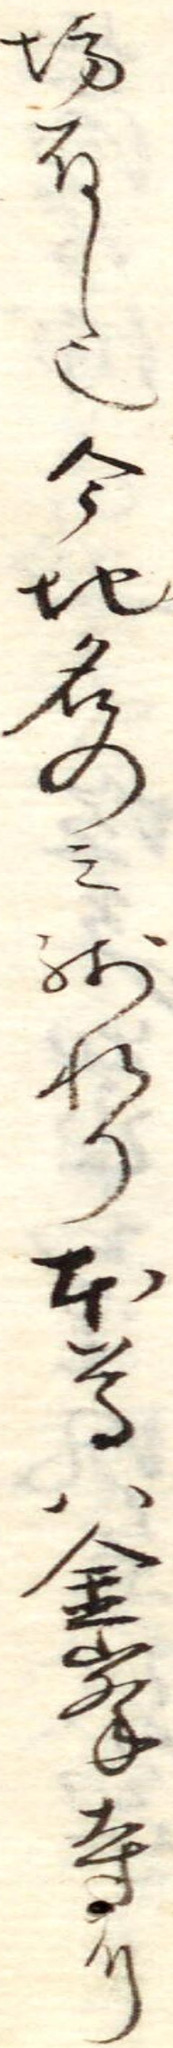坊有し也今地名のみ残れり本尊は金峰寺に
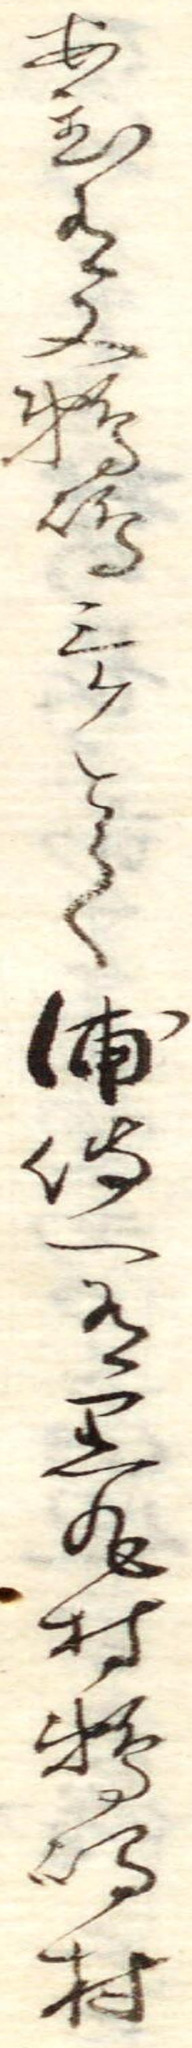安置有又鵜嶋三ヶとて浦伝へ有黒丸村鵜嶋村
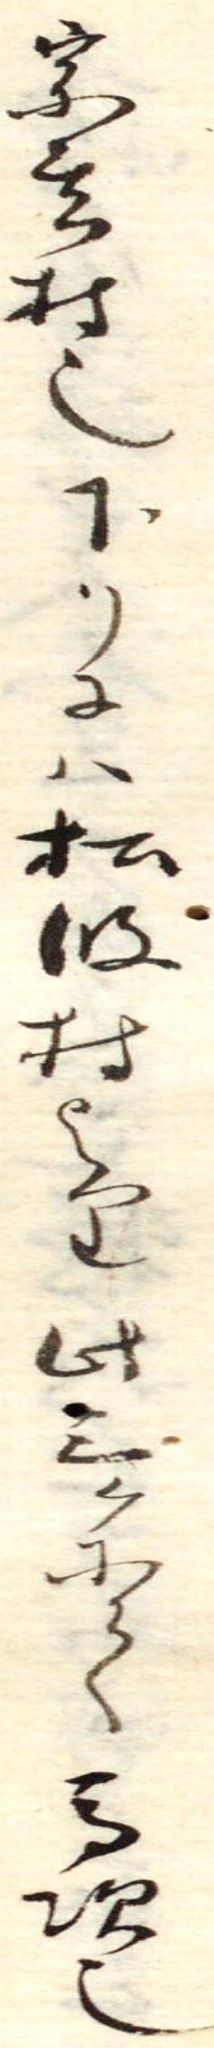宗玄村也下りには松波村よりこの此三ヶにて馬次也
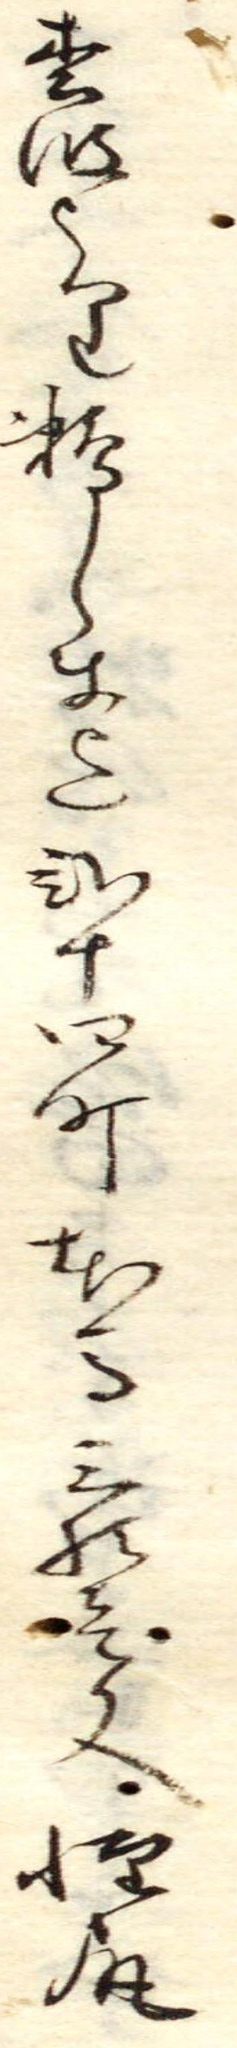杢波より鵜しま迄弐十四町本馬三拾壱文軽尻

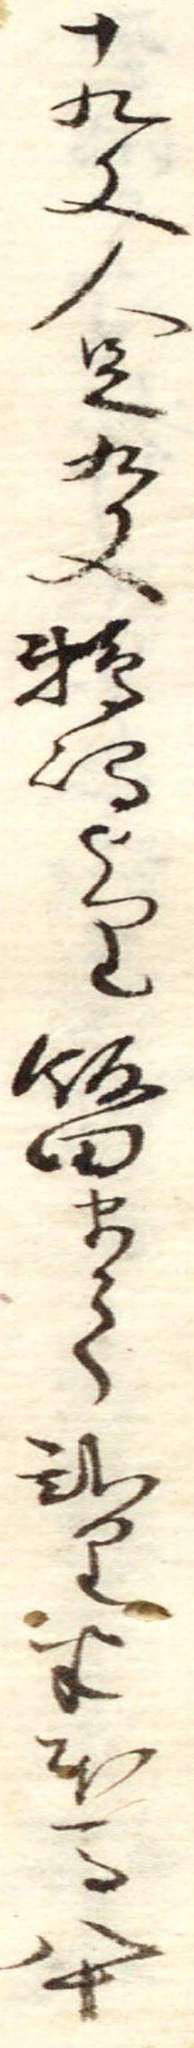十九文人足九文鵜嶋より飯田まて弐里半本馬八十
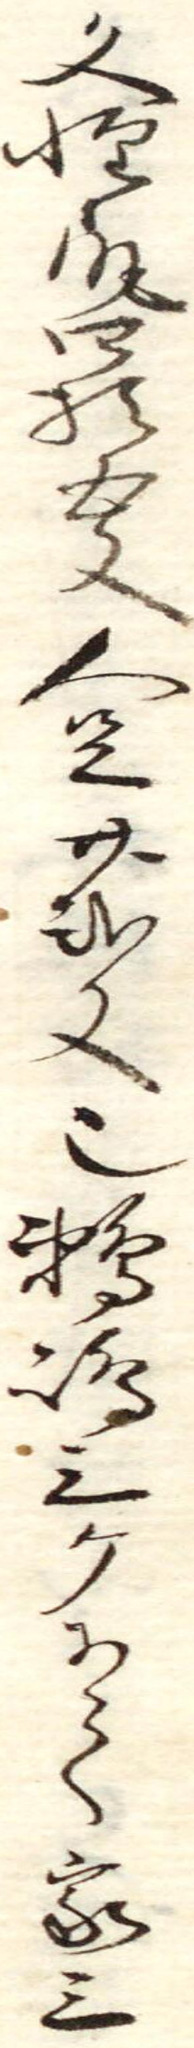文軽尻四拾五文人足廿弐文也鵜嶋三ヶにて家三
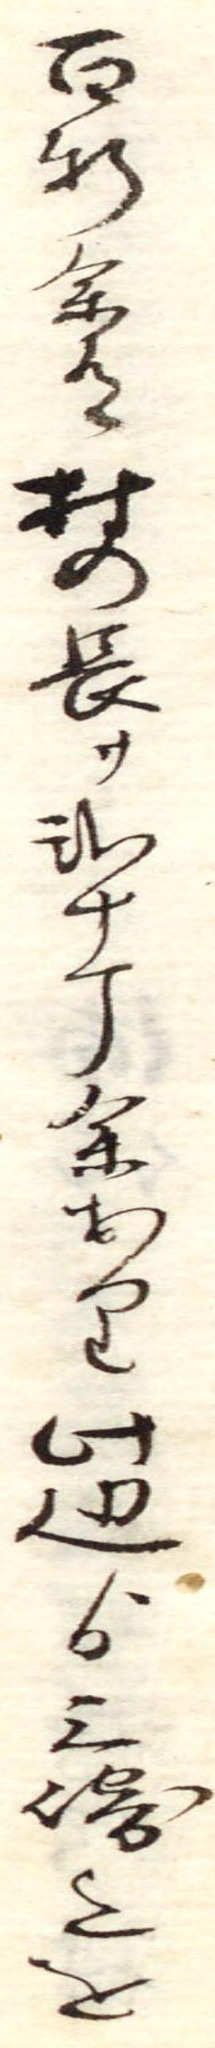百軒余有村の長さ弐十丁余あり此辺ゟ三崎迄を
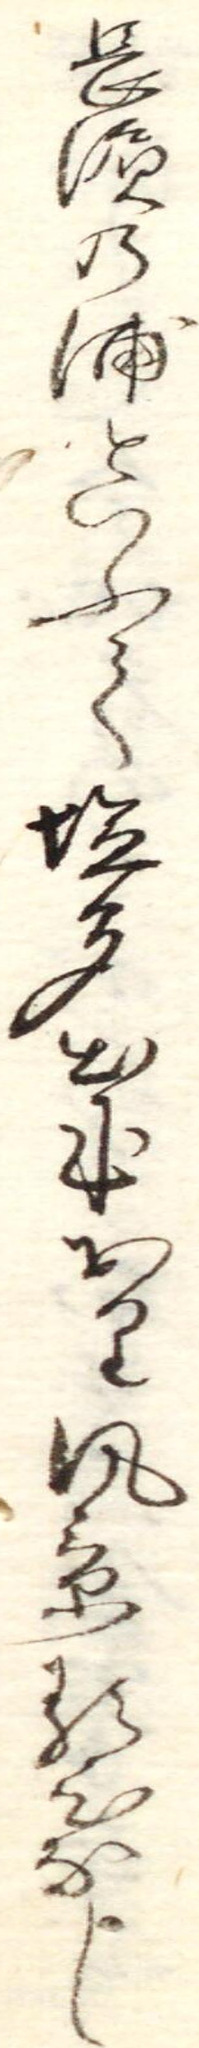長浜の浦といふて塩多出来あり風景類ひなし
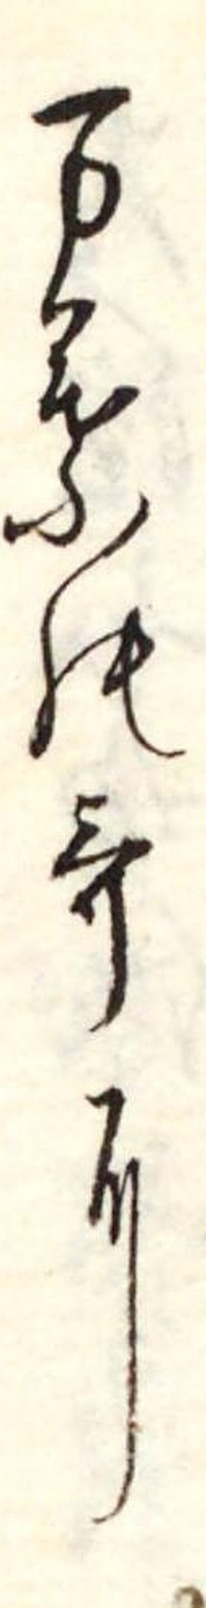万葉の歌に
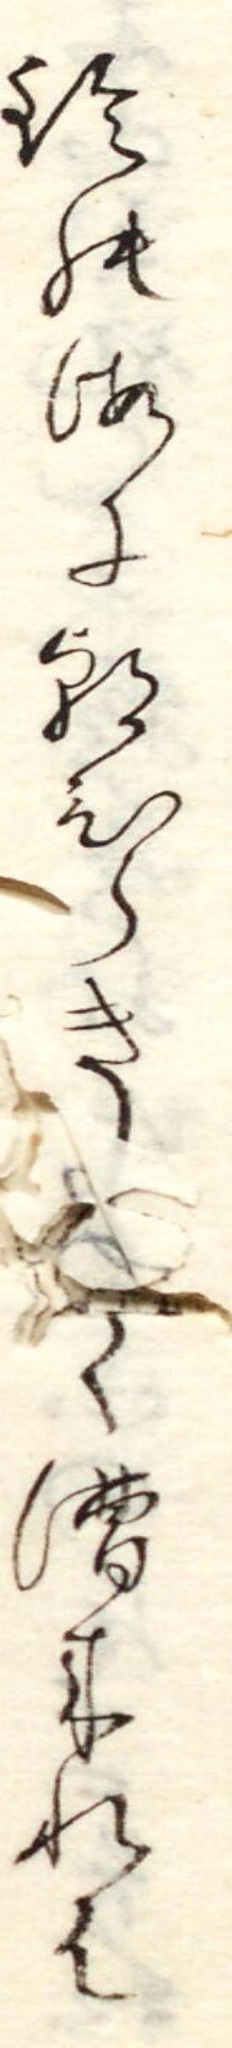鈴の海に朝ひらきして漕来れは
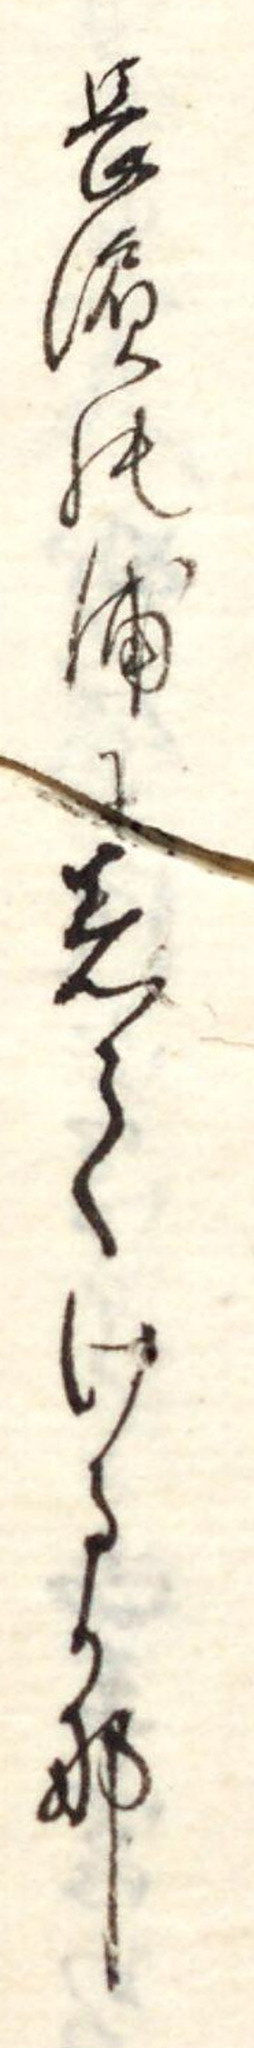長浜の浦に着てけるかな
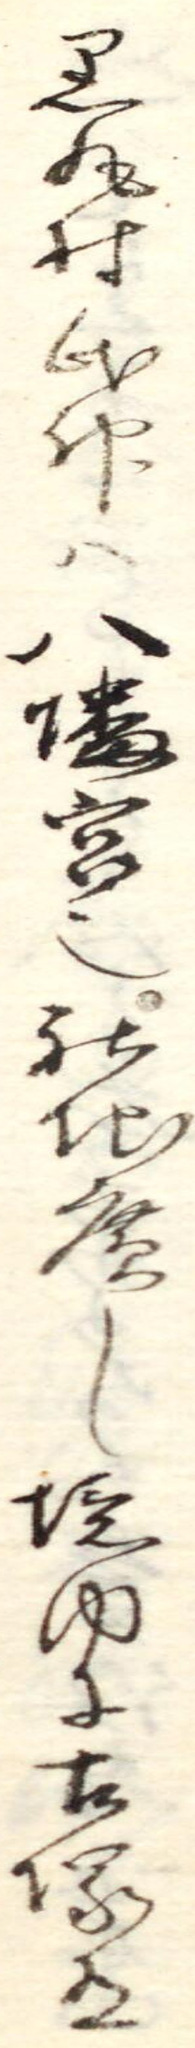黒丸村氏神は八幡宮なり社地広し境内に古塚有
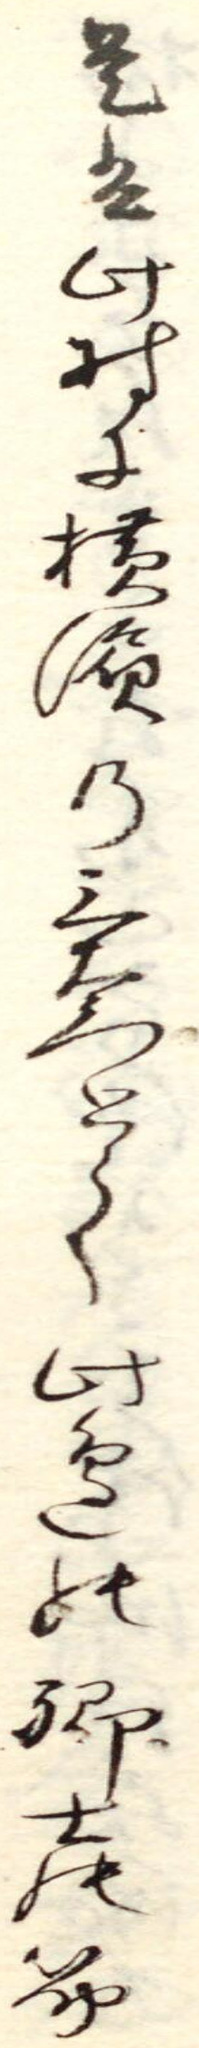是は此村に横浜の三右衛門とて此辺の郷士の筋
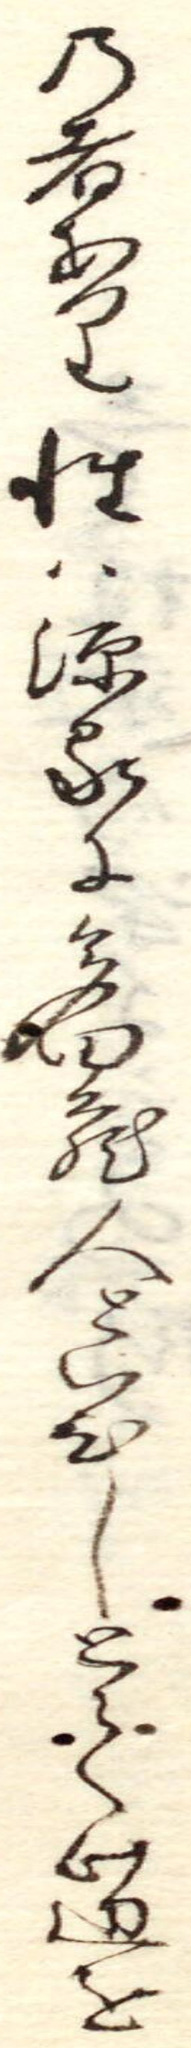の者あり性は源家に多田蔵人といひしとて此辺を
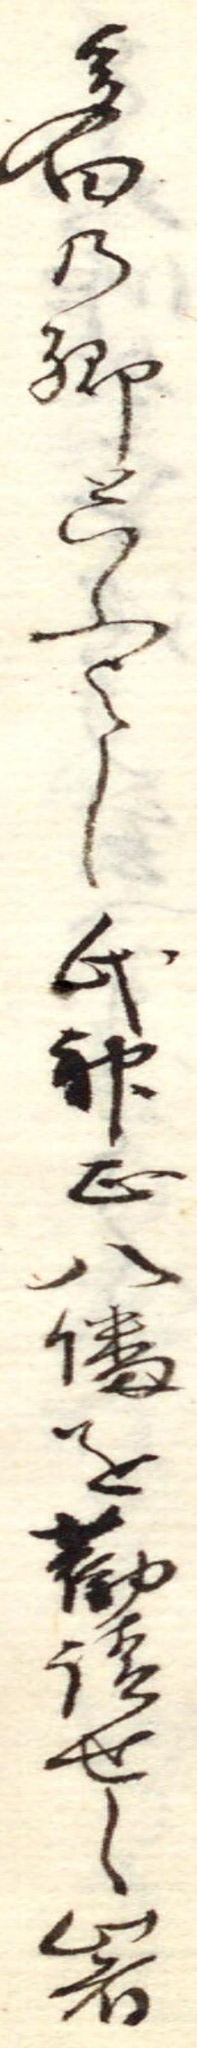多田の郷といふよし氏神正八幡を勧請せし此者
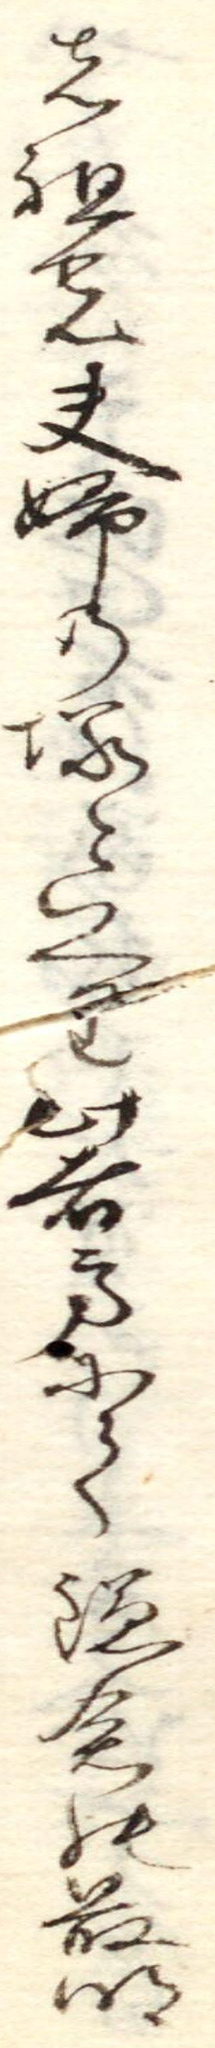先祖の夫婦の塚といへり此者方にて鎌倉の最明
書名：能登名跡誌
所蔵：Ishikawa Prefectural Library
